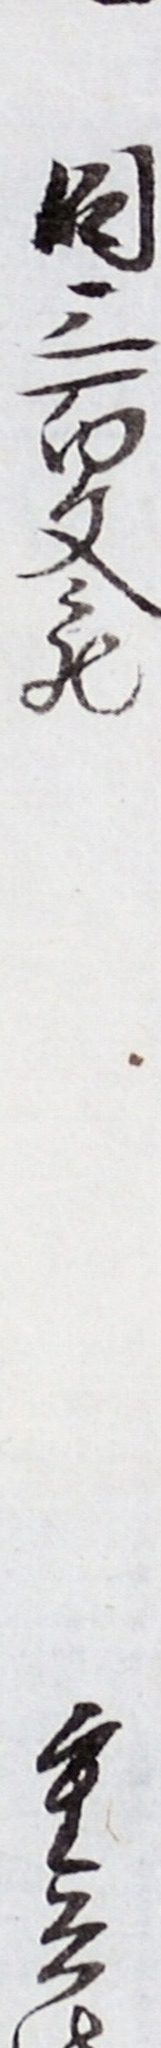一同三百文宛重兵衛
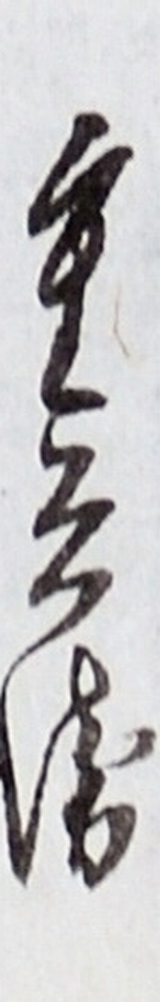利兵衛
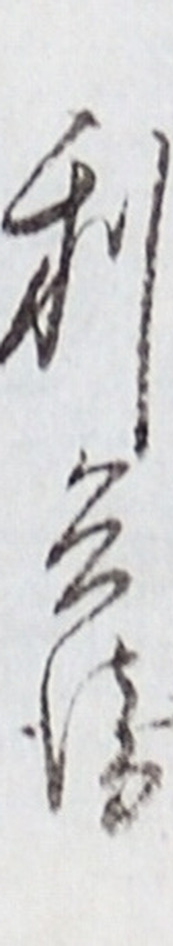利兵衛
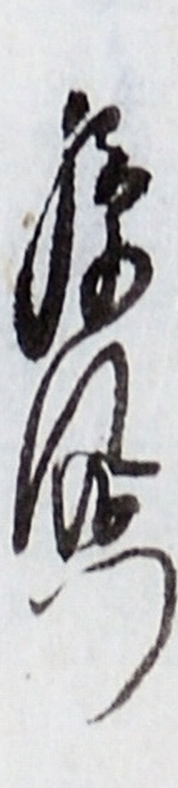孫左衛門
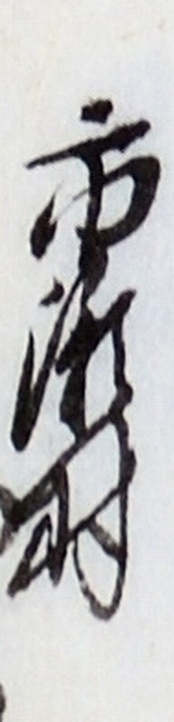市瀬村
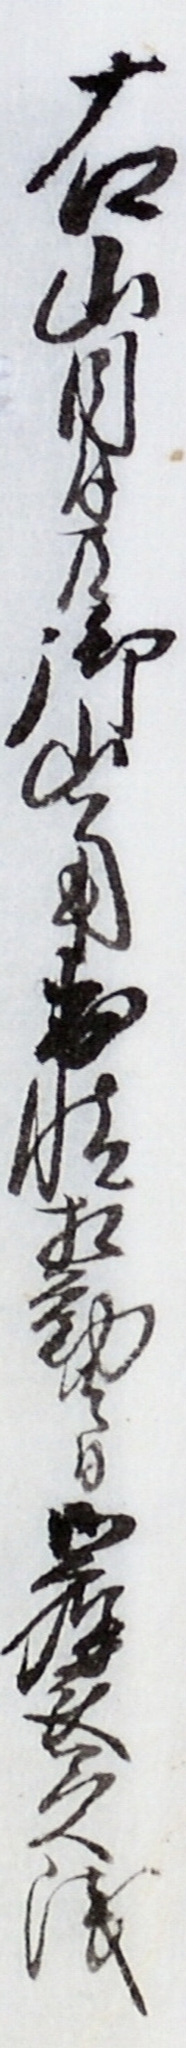右山目付共御用書帳相勤共御褒美銭
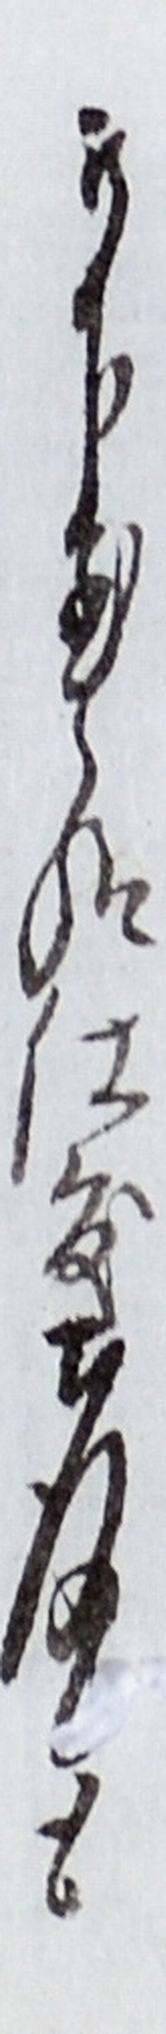被下置候様仕度御座候以上
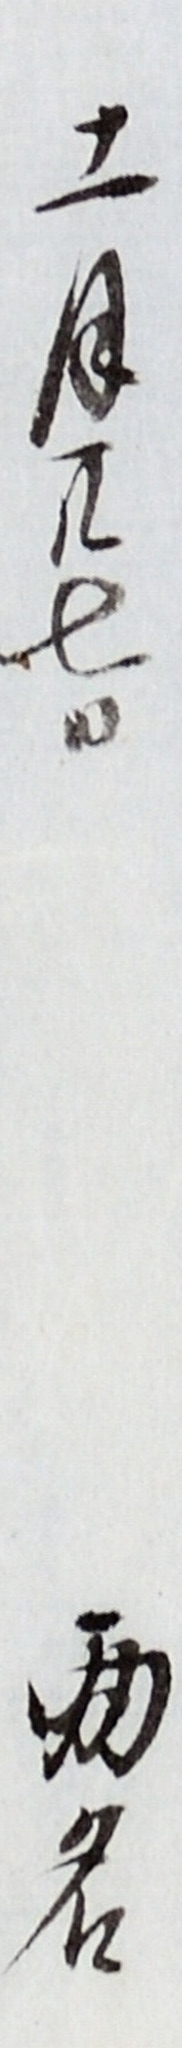十一月廿七日両名
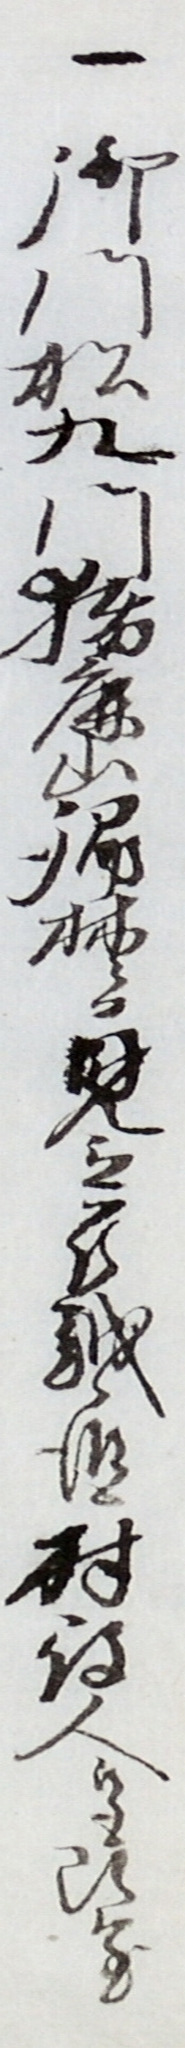一御門松丸門猪鹿山郷林ニ而見立罷越候様ニ村役人江も改置
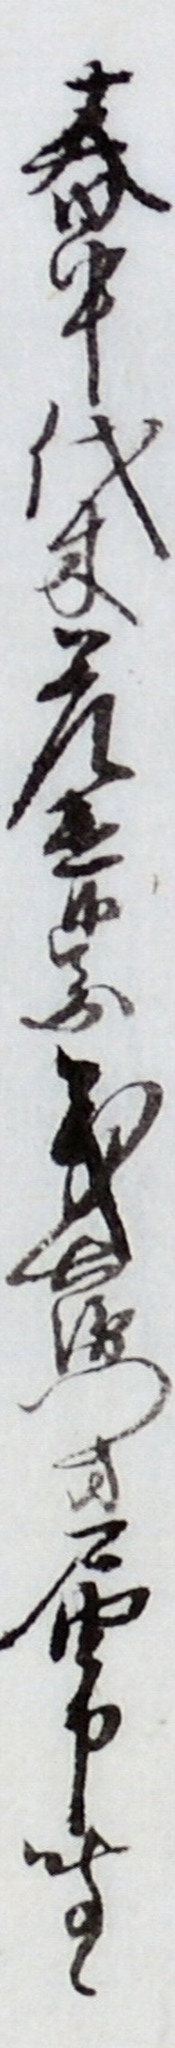春中伐木差遣候図義右衛門方届申聞候

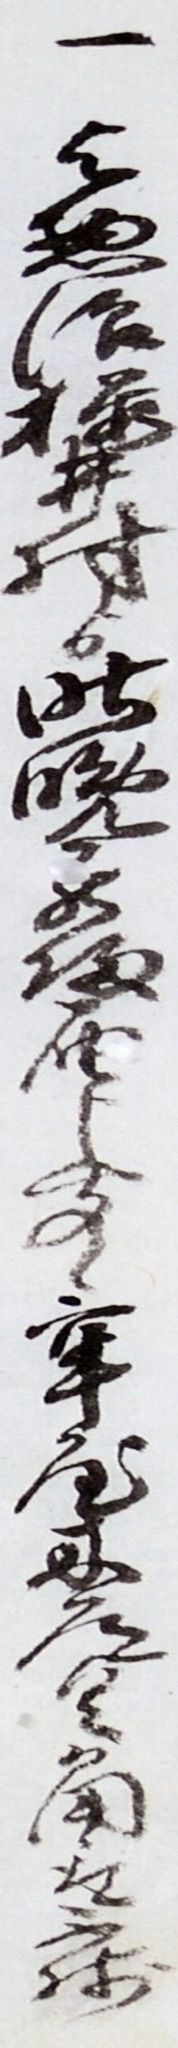一与惣治桜井村より昨晩罷帰届申聞候牢屋木道具御用取不残
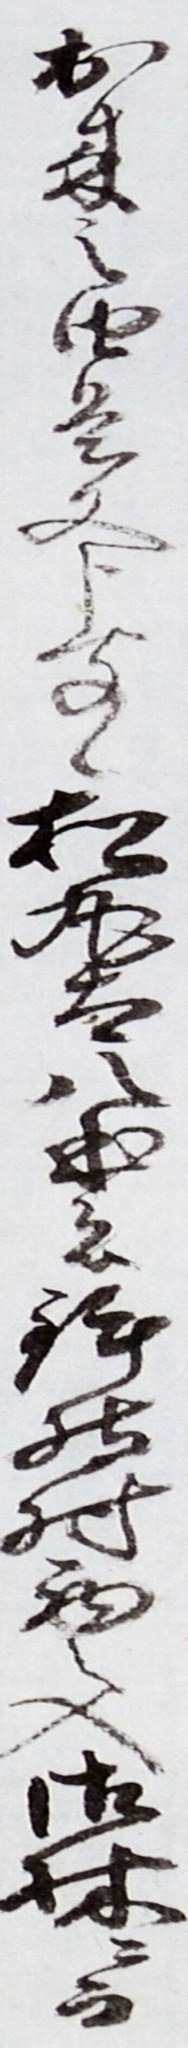出来之由是又申聞候松丸太八本は鉢持村西之入御林ニ而
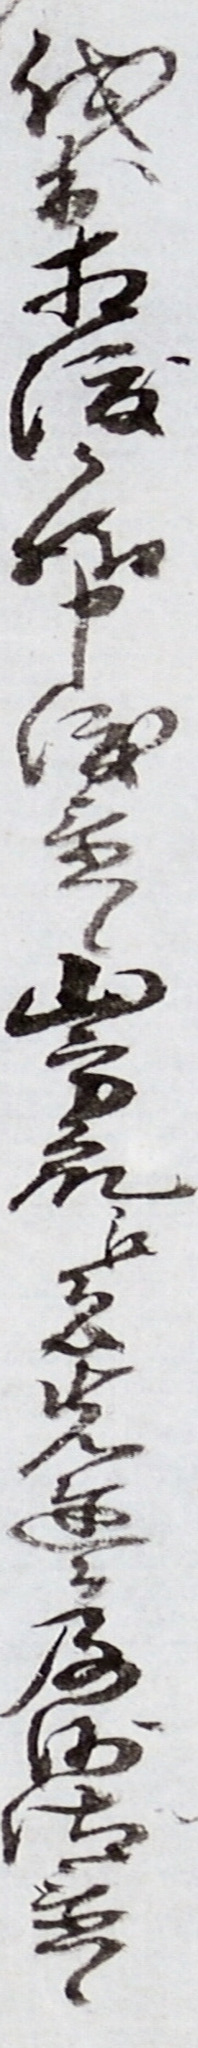伐出相渡候様申渡置候山方衆江者先達而及沙汰置候
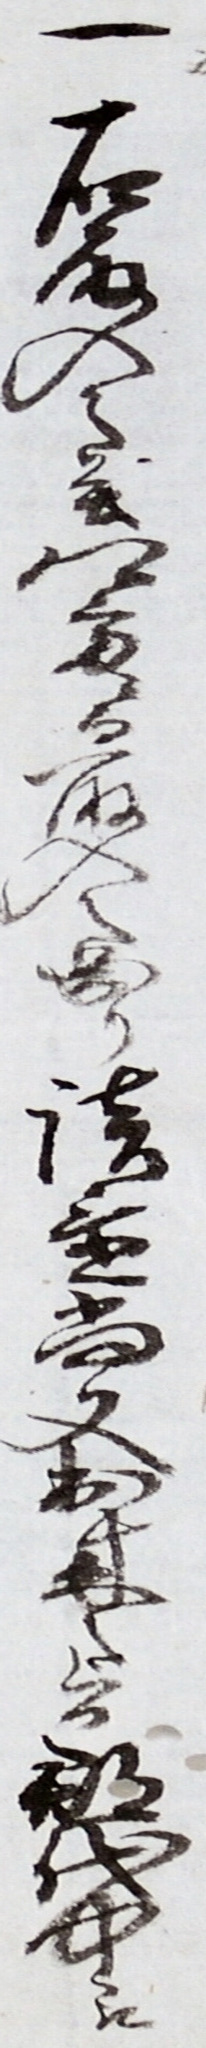一右取入之義郷方ニ而取入之図り談置尚又出来候旨郡代中江
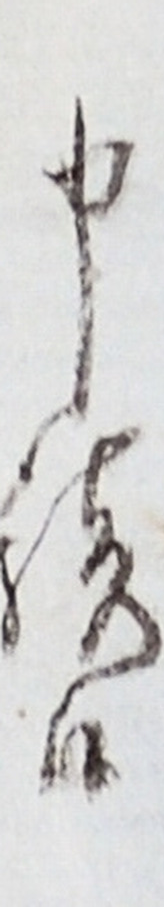申談候
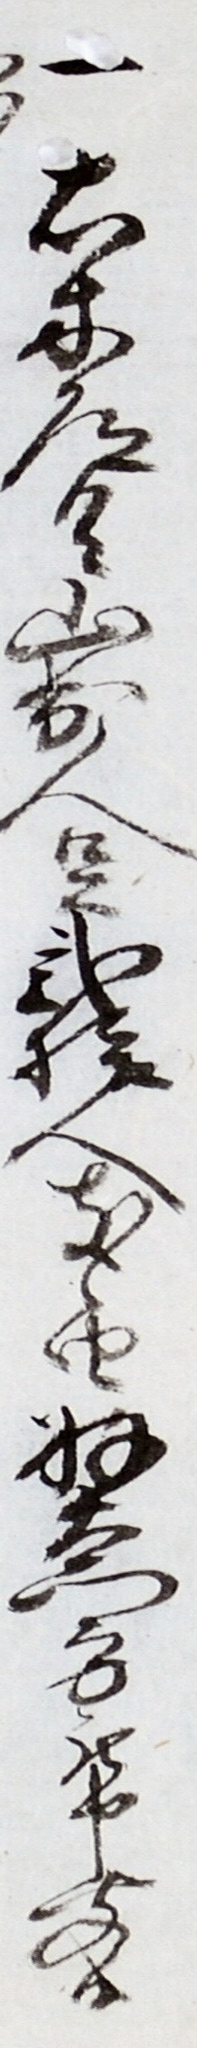一右木道具山出人足弐拾人支候由羽右衛門方被申聞候
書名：御山奉行御用控
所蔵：伊那市立高遠町図書館・合同会社AMANE
